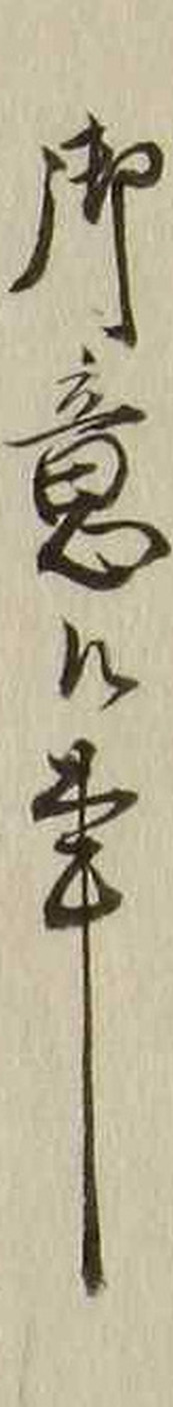御意候事
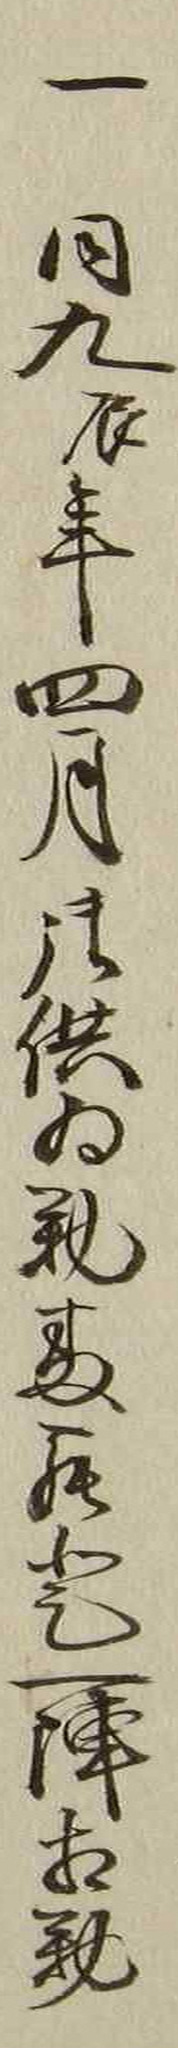一同九辰年四月御供為勤番罷登一陣相勤
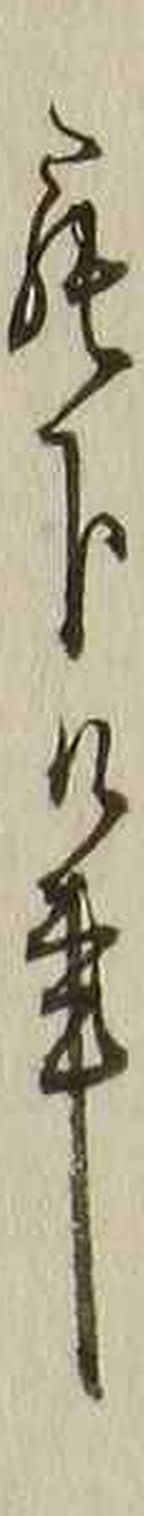罷下候事
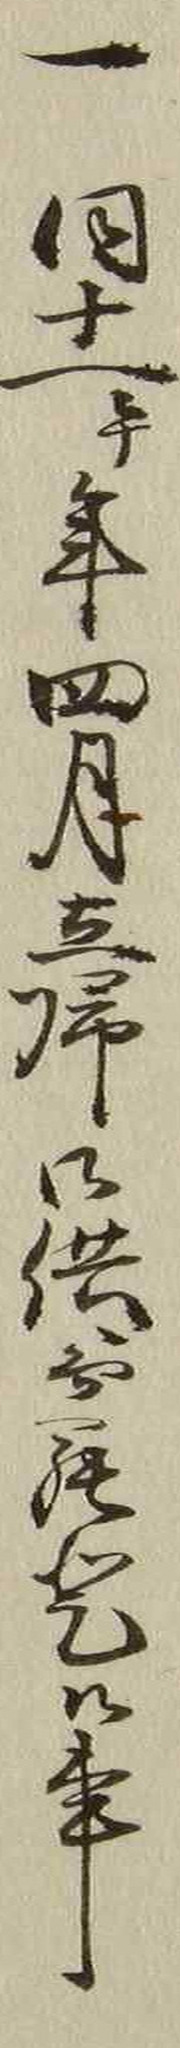一同十一午年四月立帰御供に而罷登候事
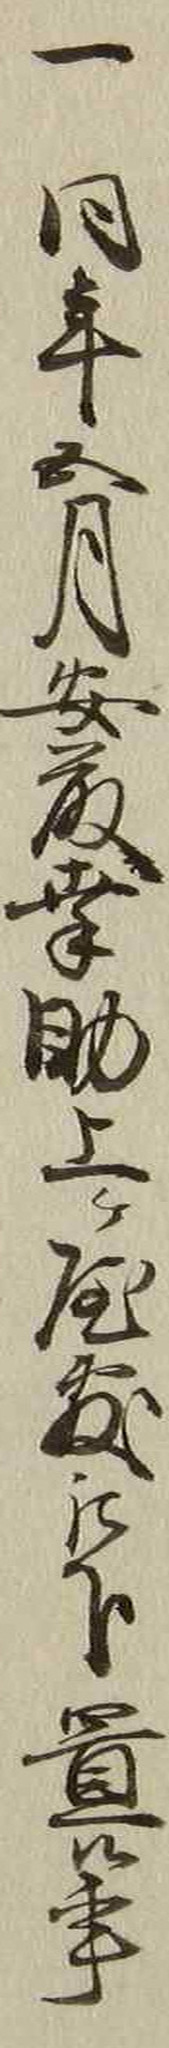一同年五月安藤幸助上ケ屋敷被下置候事
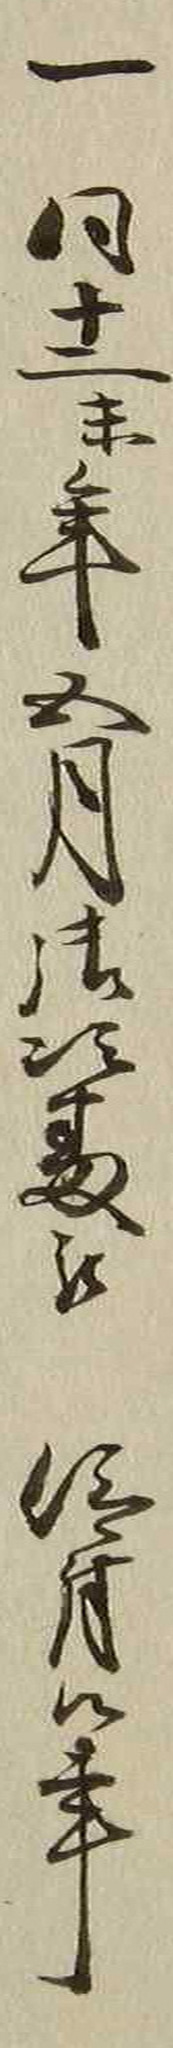一同十二未年五月御次番被仰付候事
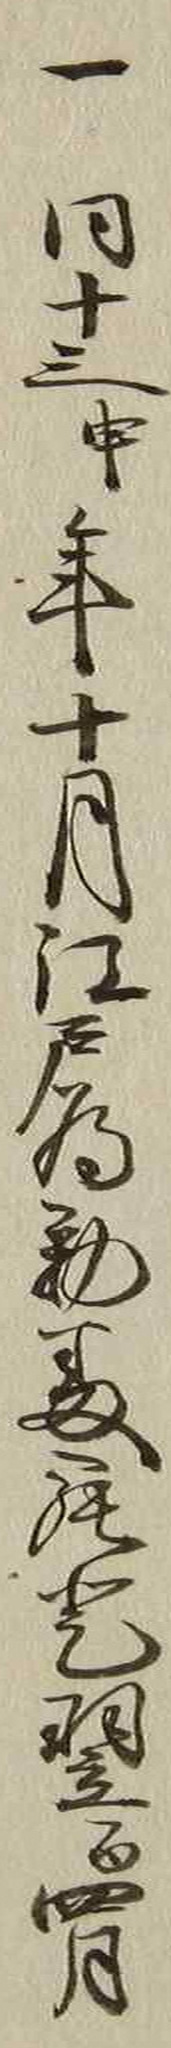一同十三申年十月江戸為勤番罷登翌酉四月
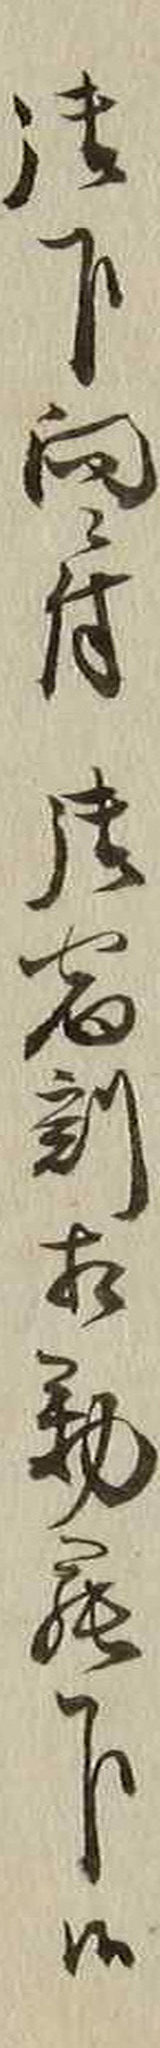御下向に付御宿割相勤罷下候
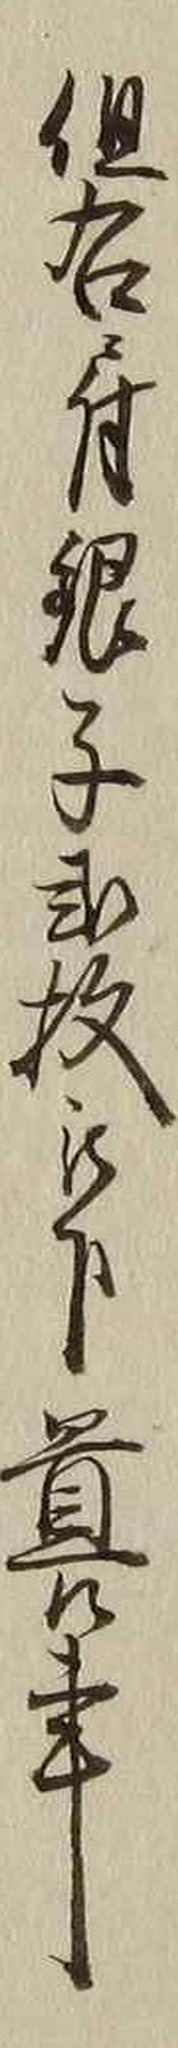但右に付銀子弐枚被下置候事
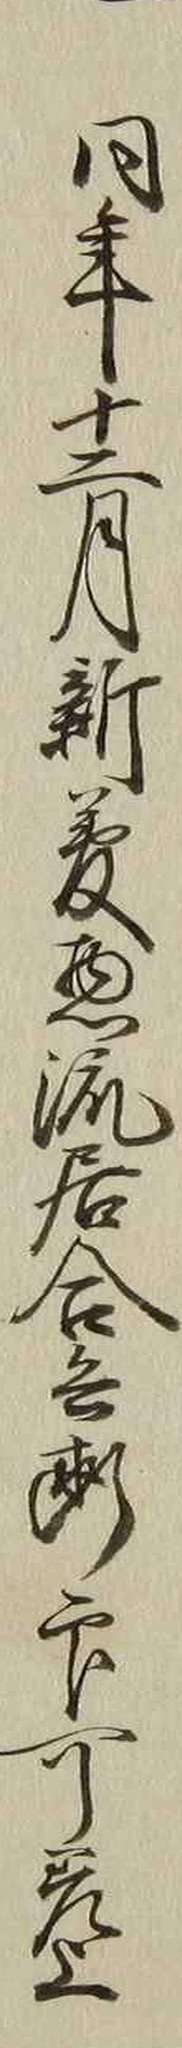一同年十二月新無想流居合兵術印可差上
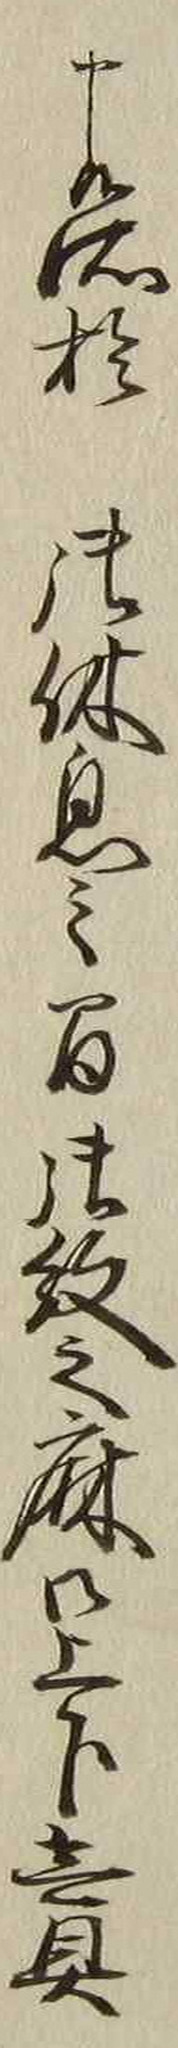申候所於御休息之間御紋之麻御上下壱具
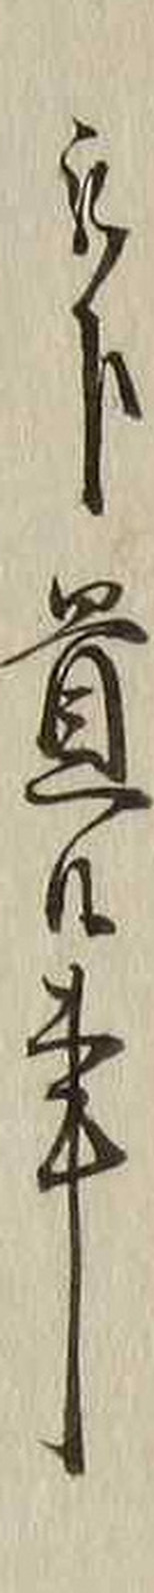被下置候事
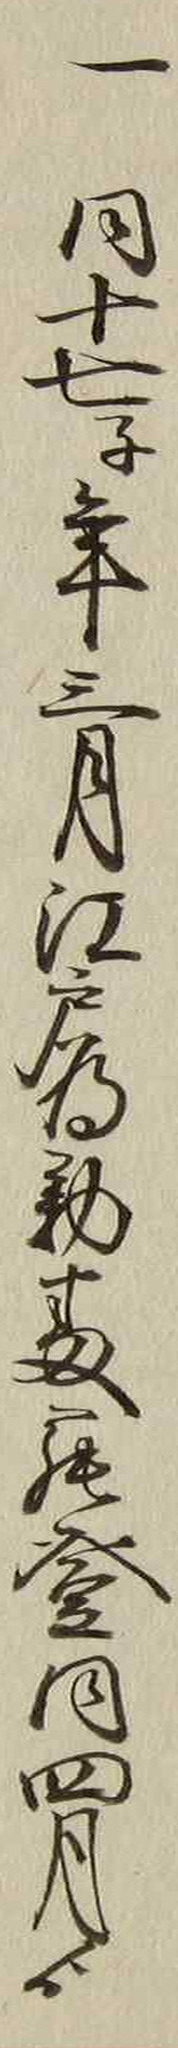一同十七子年三月江戸為勤番罷登同四月ゟ
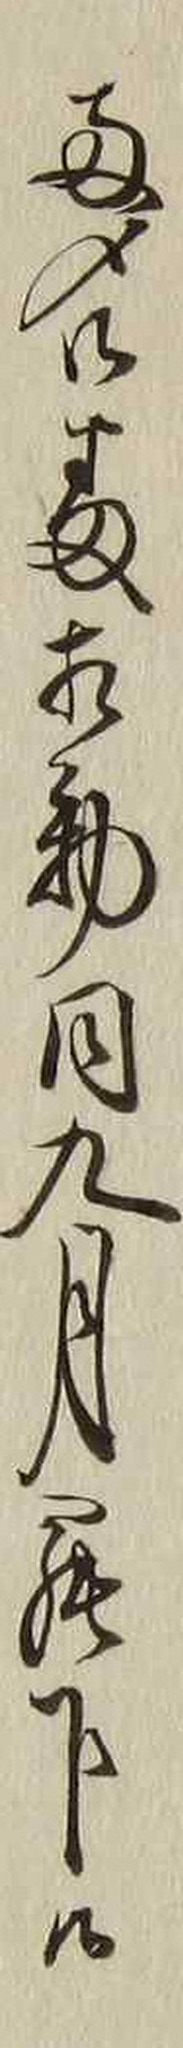両〆御番相勤同九月罷下候
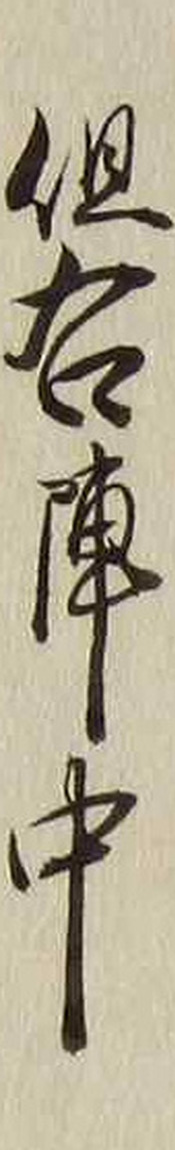但右陣中
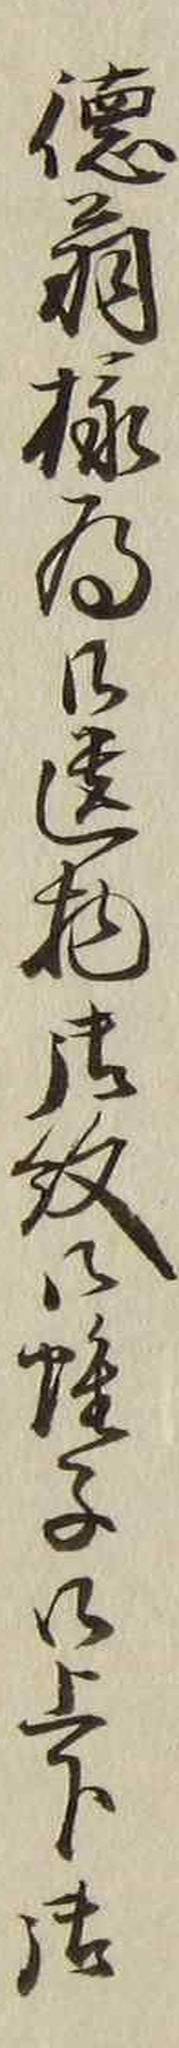徳翁様為御遺物御紋御帷子御上下御
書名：諸士系譜　巻之67　を之部1
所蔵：会津若松市立会津図書館
